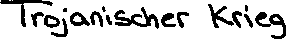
Trojanischer Krieg
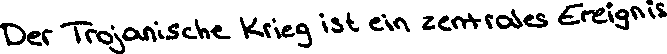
Der Trojanische Krieg ist ein zentrales Ereignis
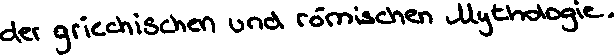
der griechischen und der römischen Mythologie.
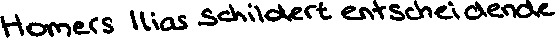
Homers Ilias schildert entscheidende
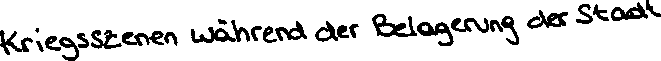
Kriegsszenen während der Belagerung der Stadt
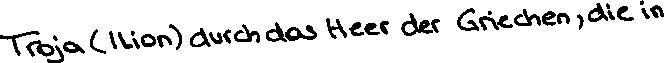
Troja (Ilion) durch das Heer der Griechen, die in
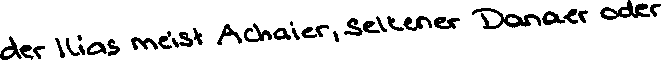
der Ilias meist Achaier, seltener Danaer oder
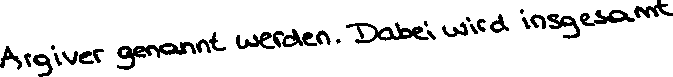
Argiver genannt werden. Dabei wird insgesamt
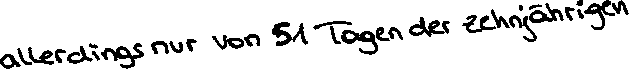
allerdings nur von 51 Tagen der zehnjährigen
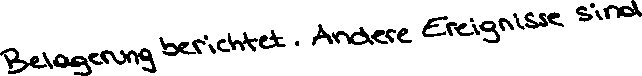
Belagerung berichtet. Andere Ereignisse sind
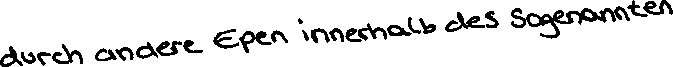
durch andere Epen innerhalb des sogenannten
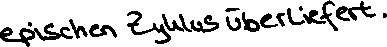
epischen Zyklus überliefert.
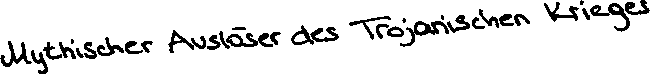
Mythischer Auslöser des Trojanischen Krieges
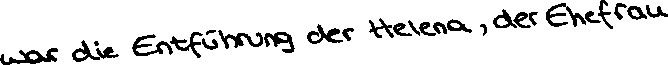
war die Entführung der Helena, der Ehefrau
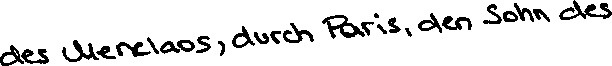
des Menelaos, durch Paris, den Sohn des
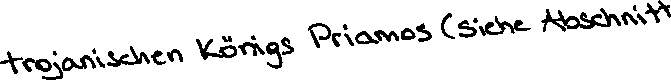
trojanischen Königs Priamos (siehe Abschnitt
